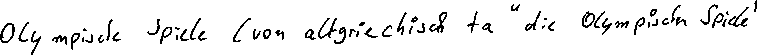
Olympische Spiele (von altgriechisch ta "die Olympischen Spiele"
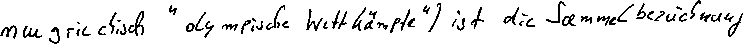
neugriechisch "olympische Wettkämpfe") ist die Sammelbezeichnung
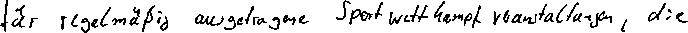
für regelmäßig ausgetragene Sportwettkampfveranstaltungen, die
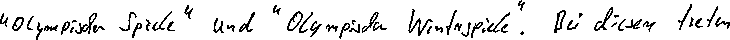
"Olympischen Spiele" und "Olympischen Winterspiele". Bei diesen treten
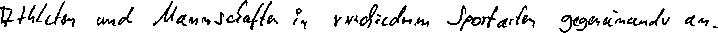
Athleten und Mannschaften in verschiedenen Sportarten gegeneinander an.
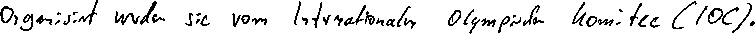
Organisiert werden sie vom Internationalen Olympischen Komitee (IOC).
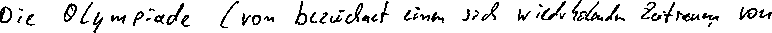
Die Olympiade (von bezeichnet einen sich wiederholenden Zeitraum von
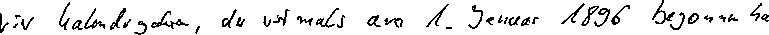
vier Kalenderjahren, der erstmals am 1. Januar 1896 begonnen ha
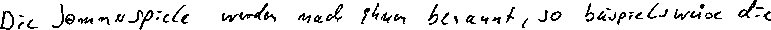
Die Sommerspiele werden nach ihnen benannt, so beispielsweise die
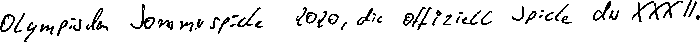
Olympischen Sommerspiele 2020, die offiziell Spiele der XXXII.
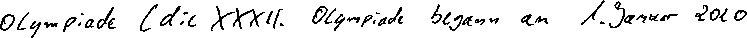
Olympiade (die XXXII. Olympiade begann am 1. Januar 2020
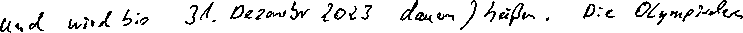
und wird bis 31. Dezember 2023 dauern) heißen. Die Olympischen
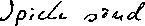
Spiele sind
